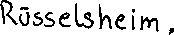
Rüsselsheim.
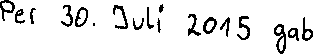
Per 30. Juli 2015 gab
